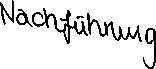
Nachführung
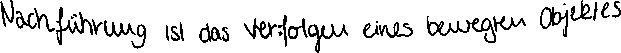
Nachführung ist das Verfolgen eines bewegten Objektes
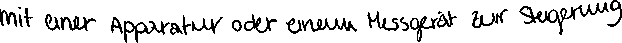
mit einer Apparatur oder einem Messgerät zur Steigerung
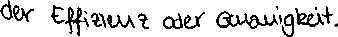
der Effizienz oder Genauigkeit.
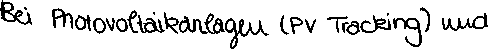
Bei Photovoltaikanlagen (PV Tracking) und
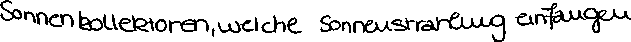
Sonnenkollektoren, welche Sonnenstrahlung einfangen
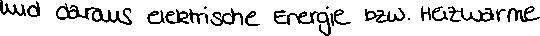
und daraus elektrische Energie bzw. Heizwärme
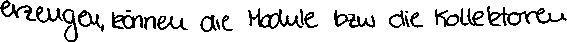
erzeugen, können die Module bzw. die Kollektoren
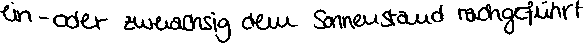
ein- oder zweiachsig dem Sonnenstand nachgeführt
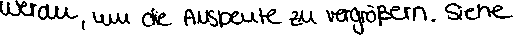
werden, um die Ausbeute zu vergrößern. Siehe
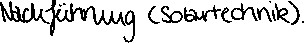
Nachführung (Solartechnik).
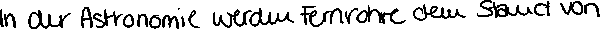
In der Astronomie werden Fernrohre dem Stand von
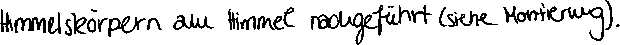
Himmelskörpern am Himmel nachgeführt (siehe Montierung).
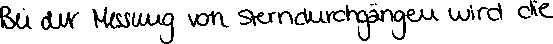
Bei der Messung von Sterndurchgängen wird die
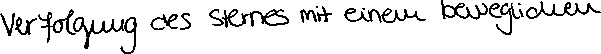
Verfolgung des Sternes mit einem beweglichen
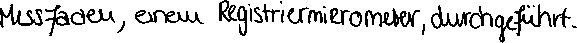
Messfaden, einem Registriermikrometer, durchgeführt.
